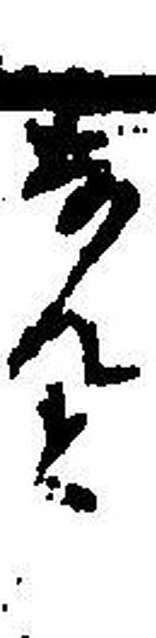なんと
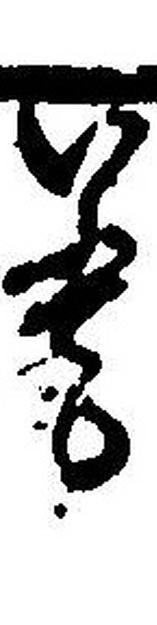いふても
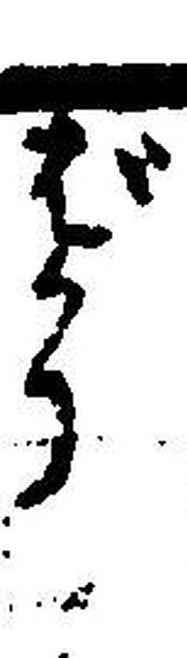ばかり
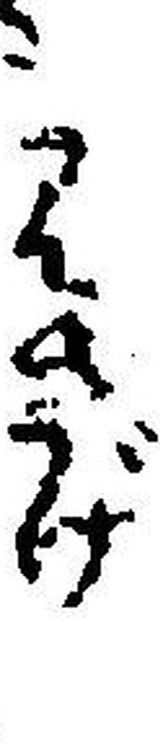見さげ
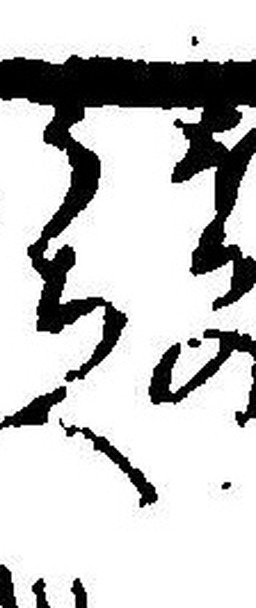うちへ
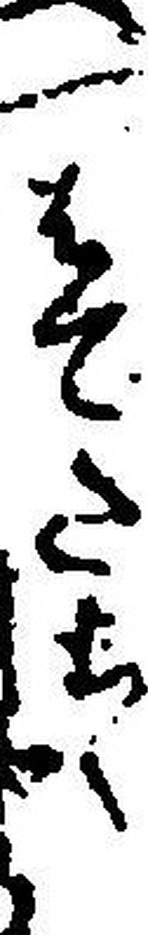はてたちく
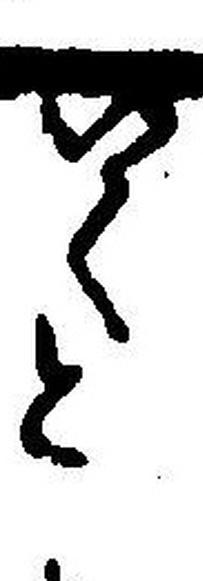いくと
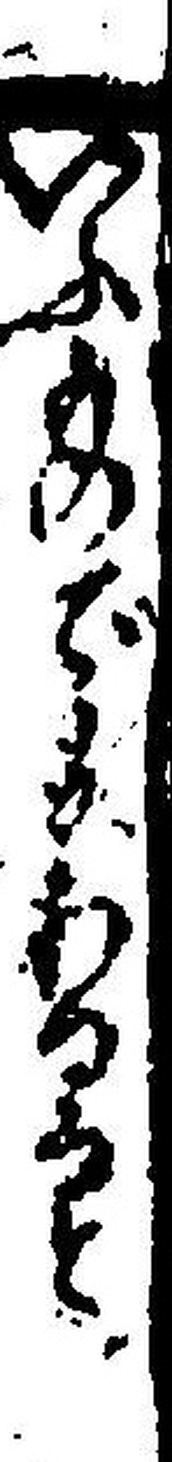いふものでもあるかと
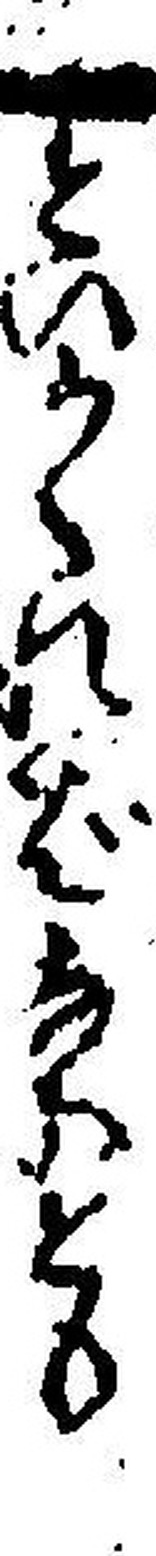といかくればなにとも
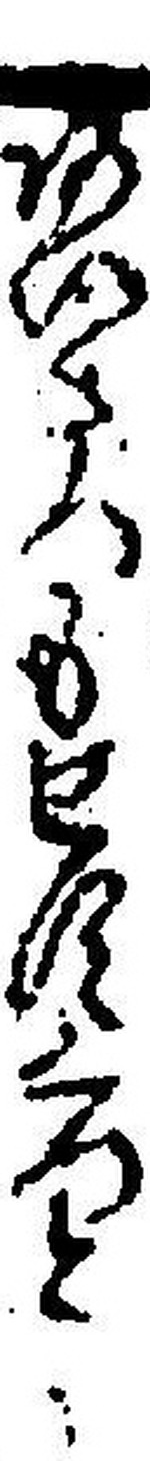あいさつもせすくつと
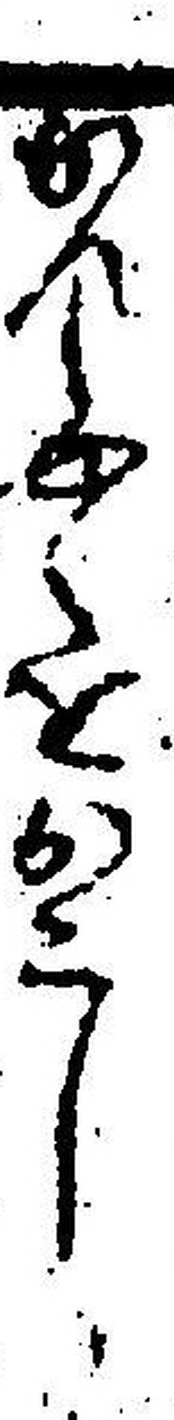かんしやくをおこし
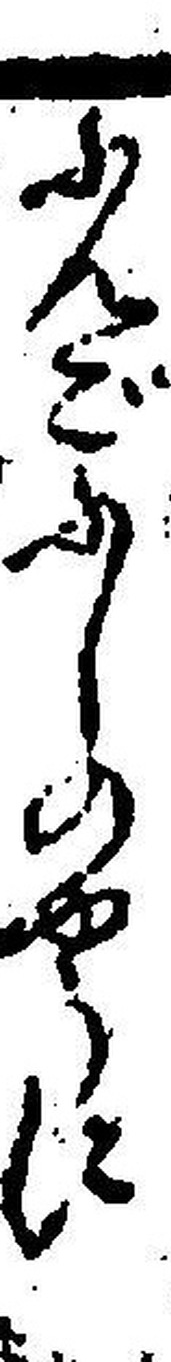ふんごふしのやうに
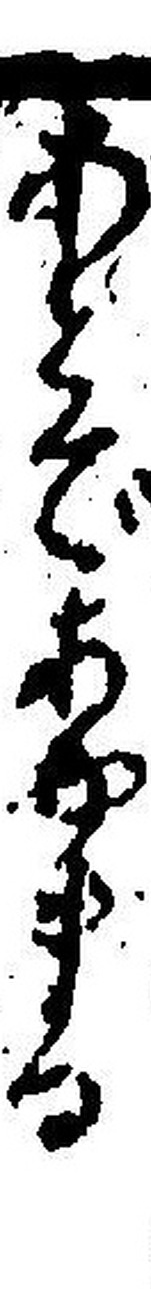あとであやまる
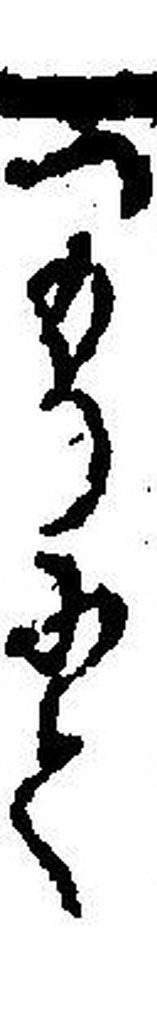つもりにて
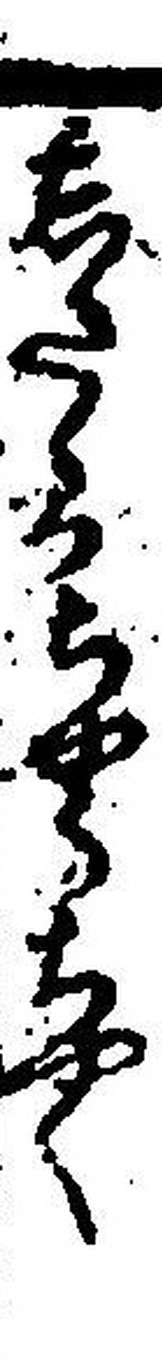したゝかちやうちゃく
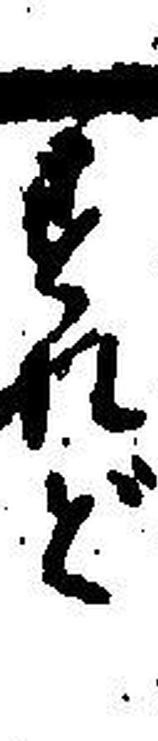すれど
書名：御代参牛時詣 / 市場通笑作
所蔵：東京大学総合図書館 General Library in the University of Tokyo, JAPAN
